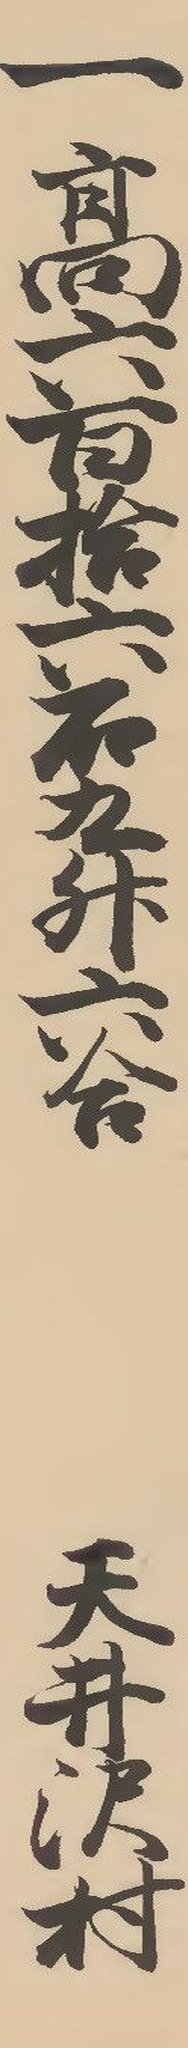一高六百拾六石九升六合天井沢村
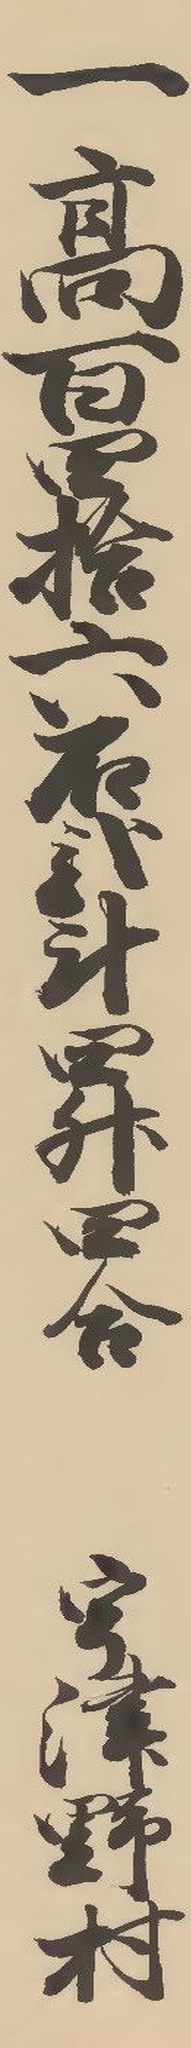一高百四拾六石弐斗四升四合宇津野村
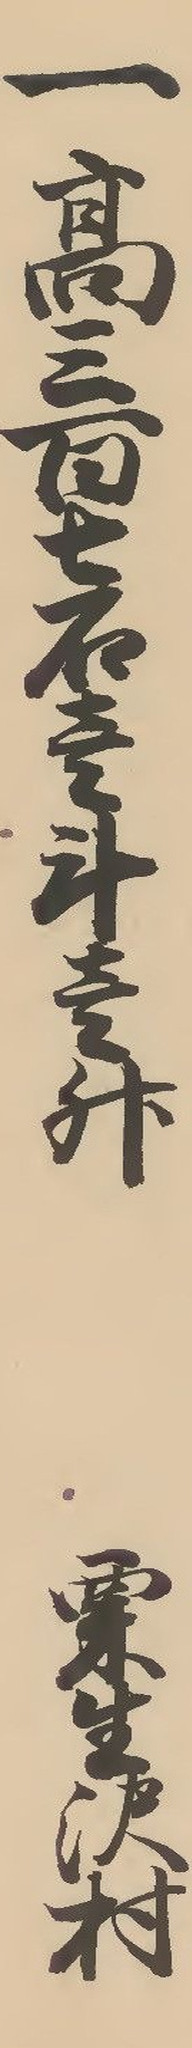一高三百七石壱斗壱升栗生沢村

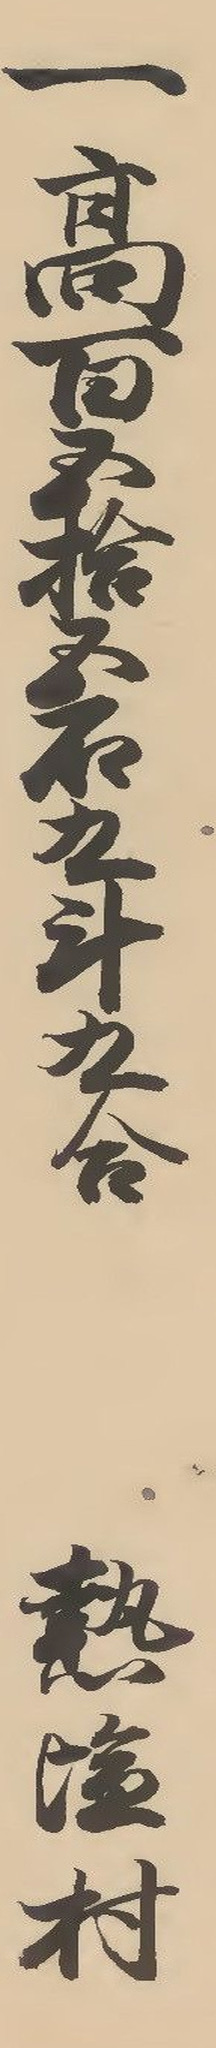一高百五拾五石九斗九合熱塩村
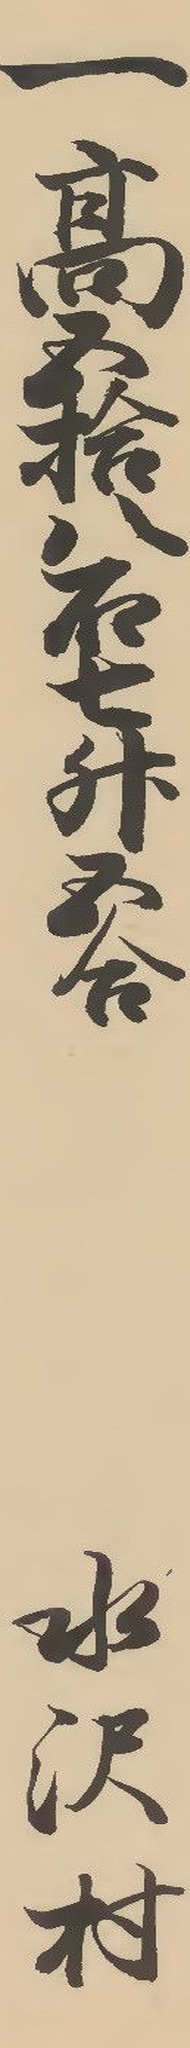一高五拾八石七升五合水沢村
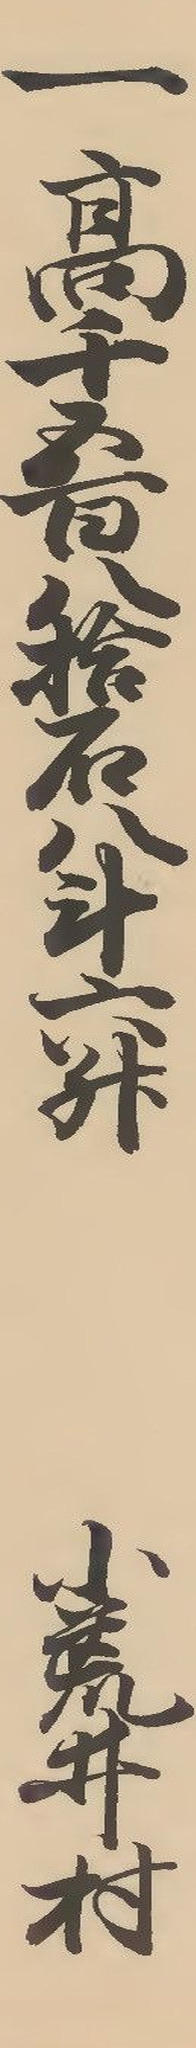一高千五百八拾石八斗六升小荒井村
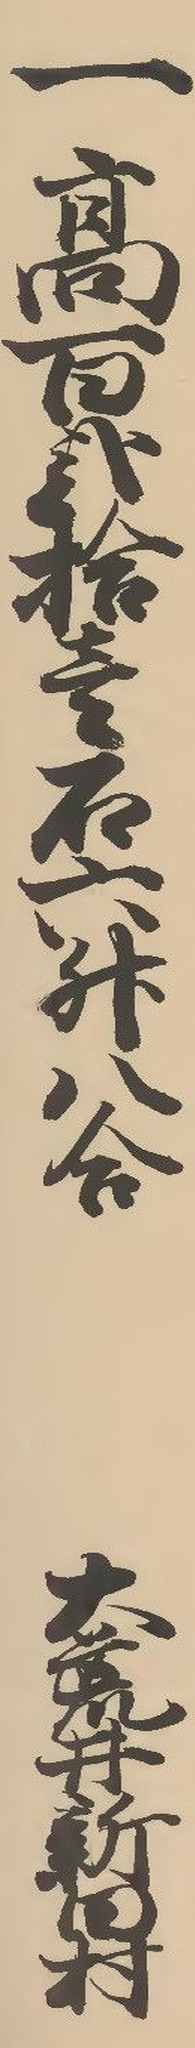一高百弐拾壱石六升八合大荒井新田村
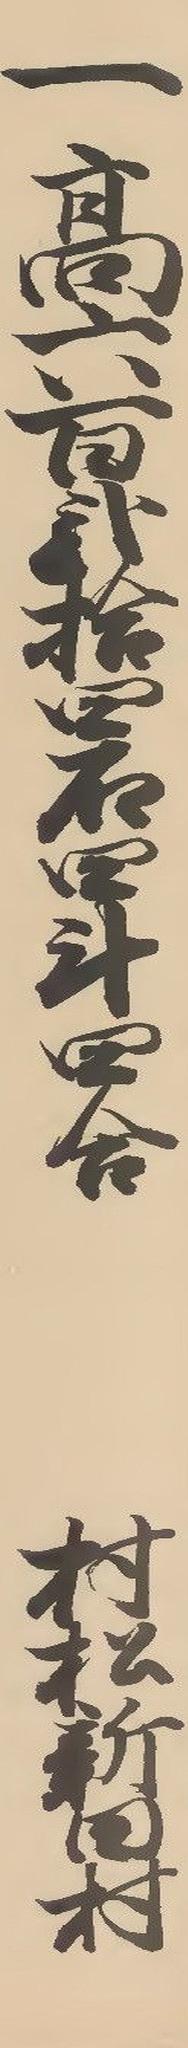一高六百弐拾四石四斗四合村松新田村
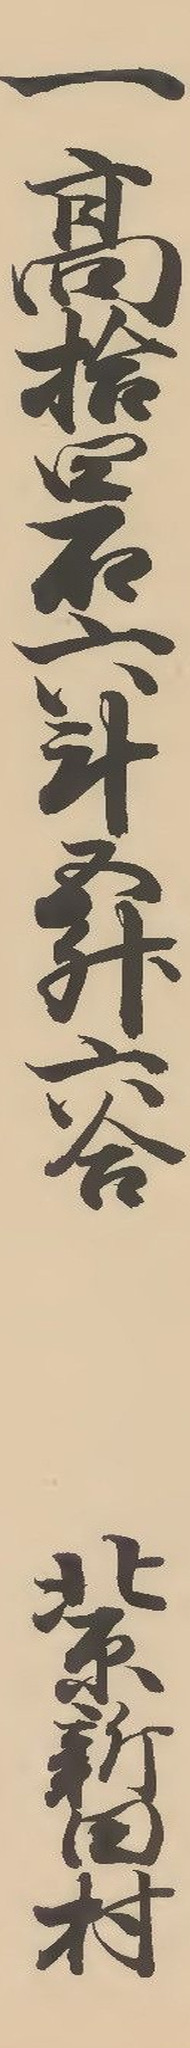一高拾四石六斗五升六合北原新田村
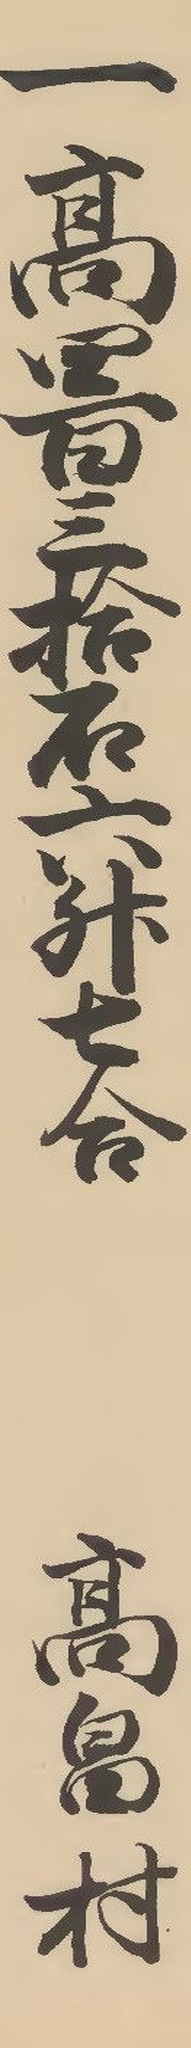一高四百三拾石六升七合高畠村
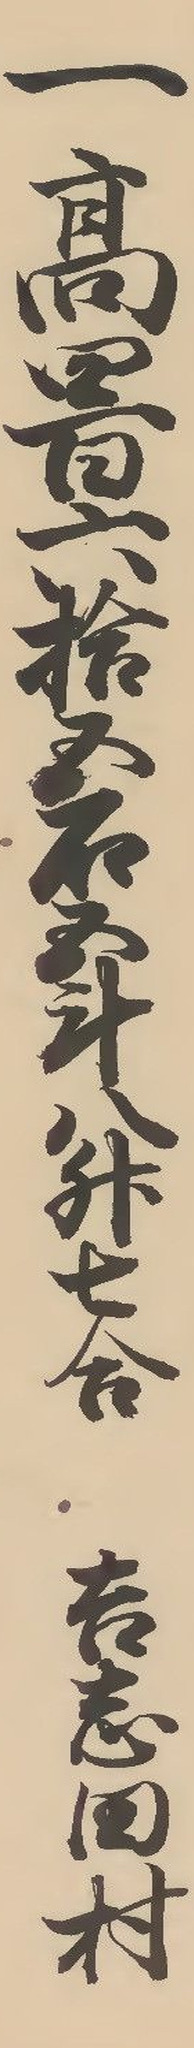一高四百六拾五石五斗八升七合吉志田村

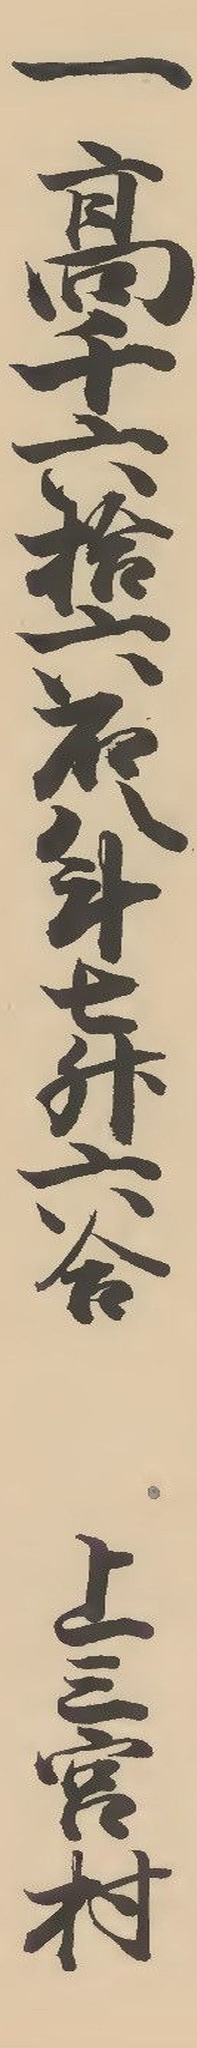一高千六拾六石八斗七升六合上三宮村
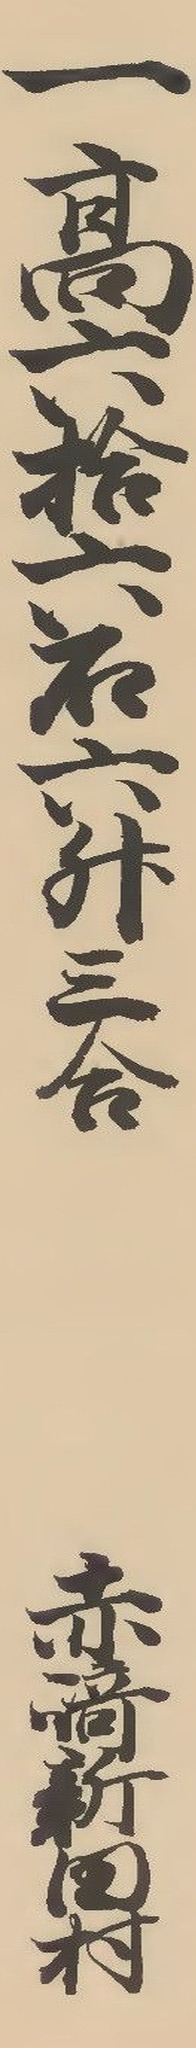一高六拾六石六升三合赤崎新田村
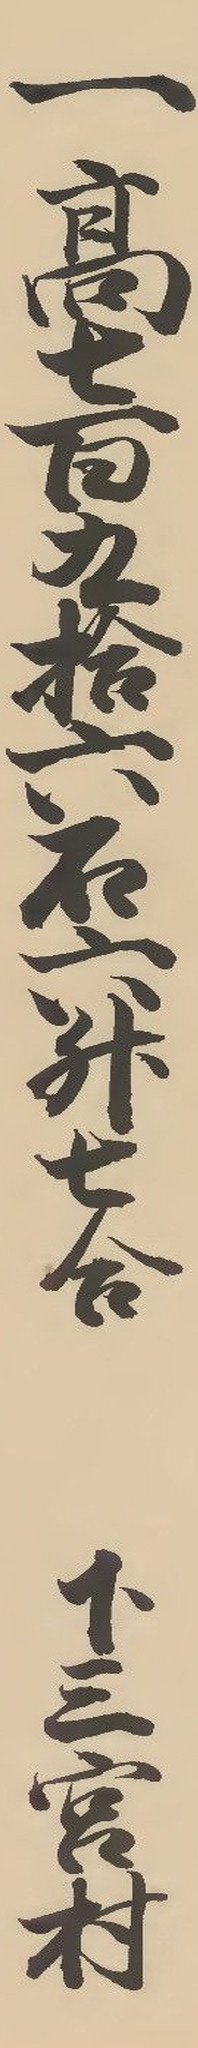一高七百九拾六石六升七合下三宮村
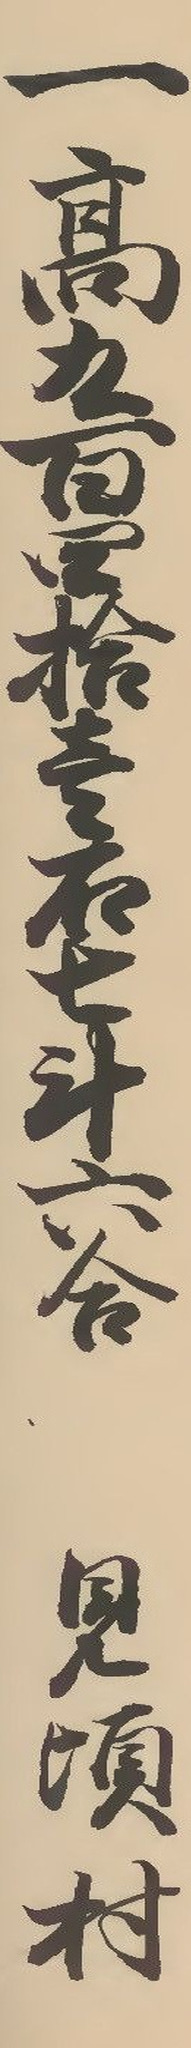一高九百四拾壱石七斗六合見頃村
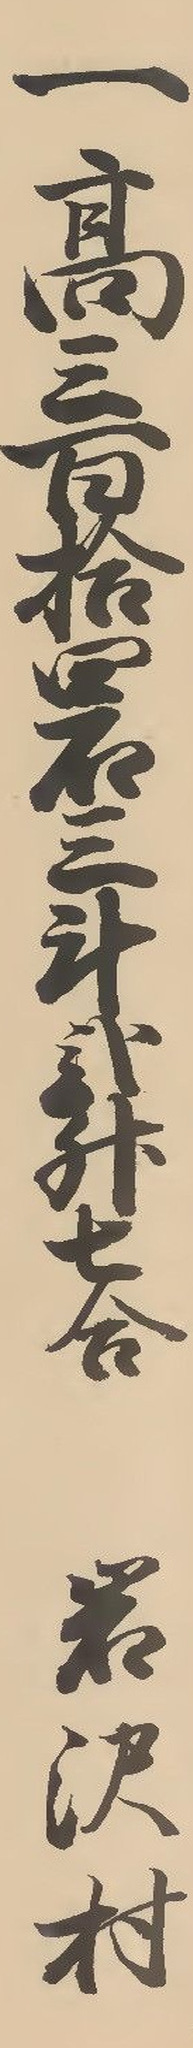一高三百拾四石三斗弐升七合岩沢村
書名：陸奥国郷帳　１
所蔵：国立公文書館 National Archives of Japan
